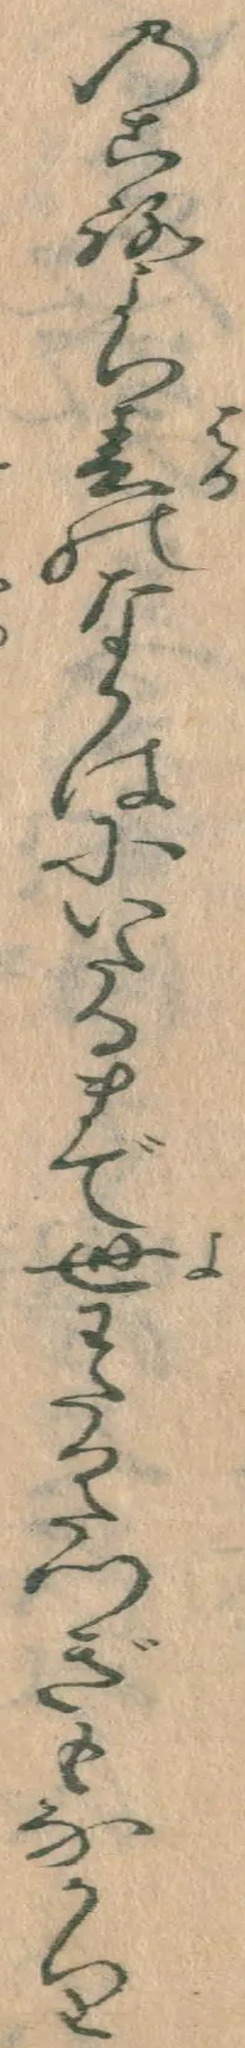のころより春のなかはにいたるまで世わたるたつぎもなかり
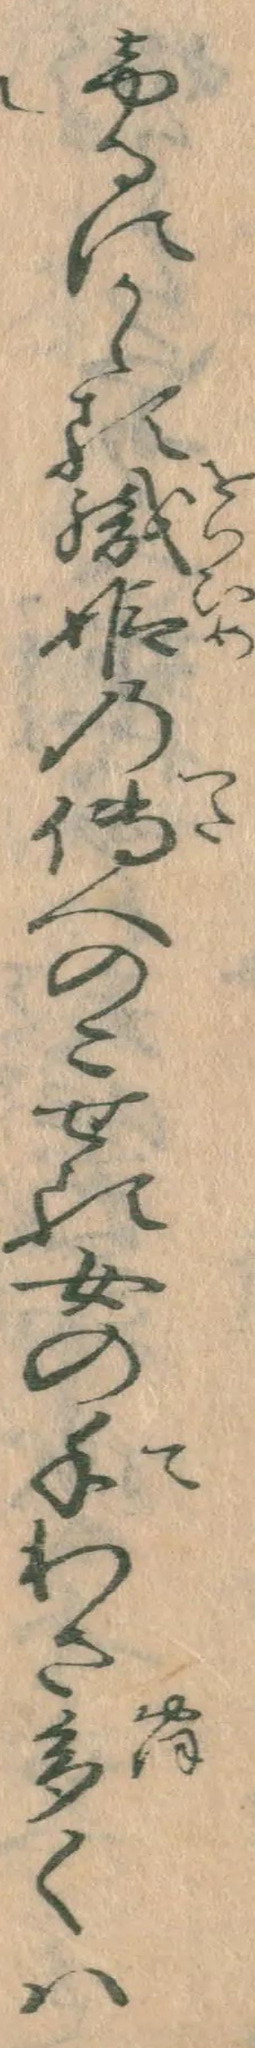けるにかゝる織姫の伝へのこせる女の手わさ多くは
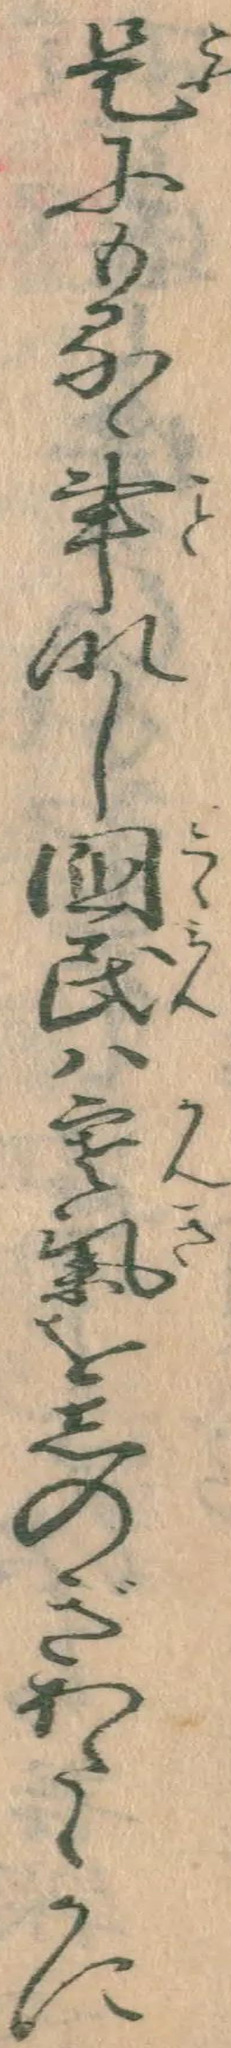是にもるゝ事なし国民は寒気をしのぎあたゝかに
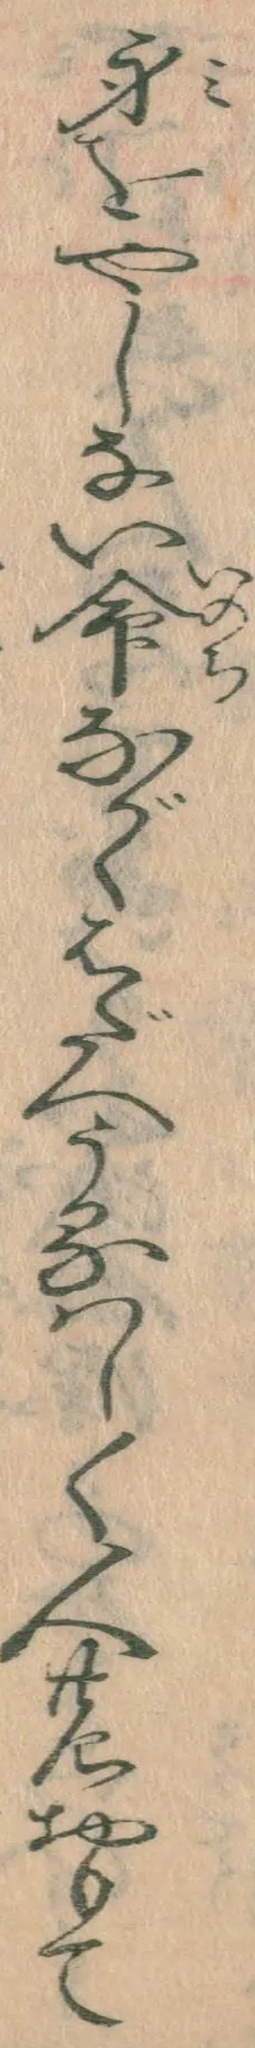身をやしない命ながくはだへうるはしく人のおもて
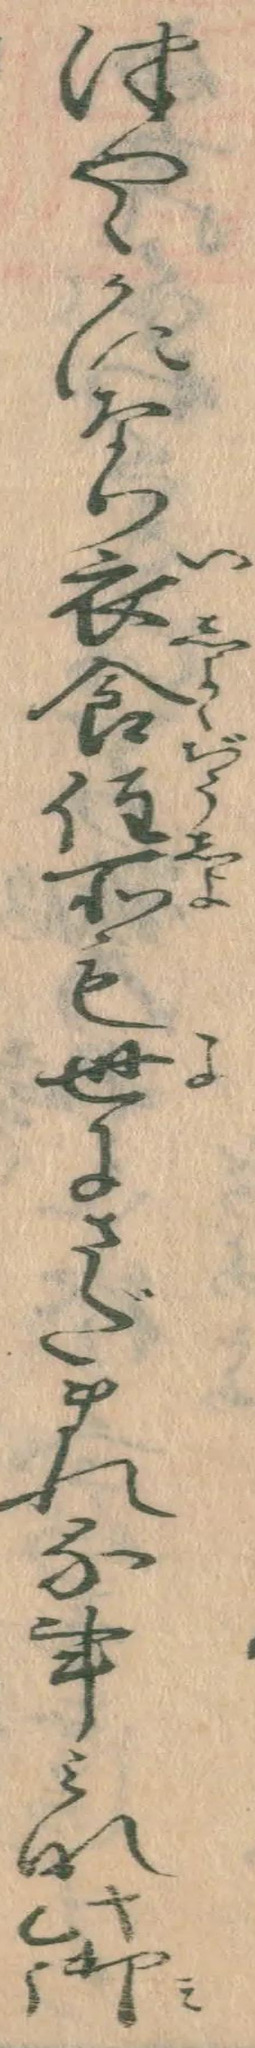つやゝかになり衣食住所も世にさだまれる事みな此御
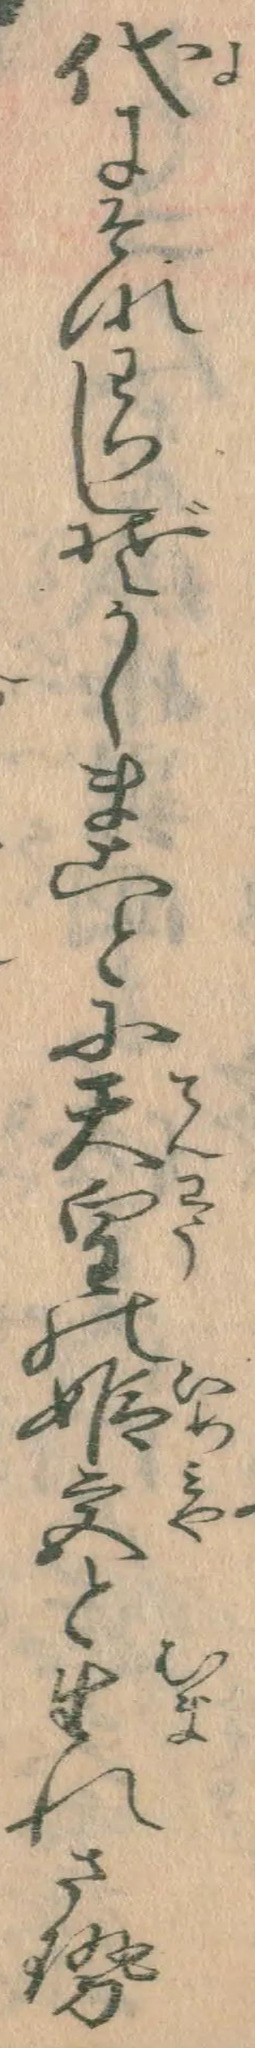代にそなわりしぞかしまことに天皇の姫宮と生れさせ
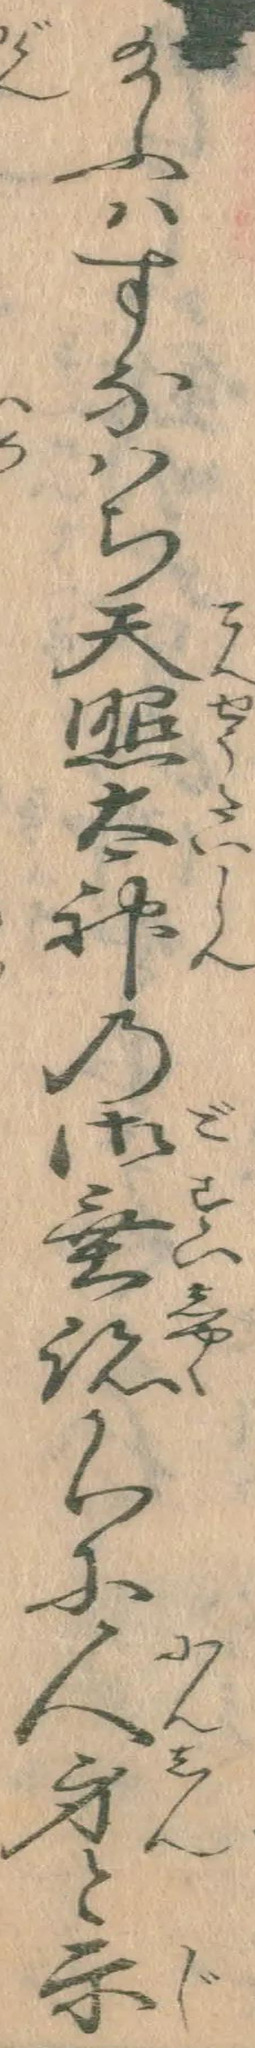給ふはすなはち天照太神の御垂跡かりに人身と示
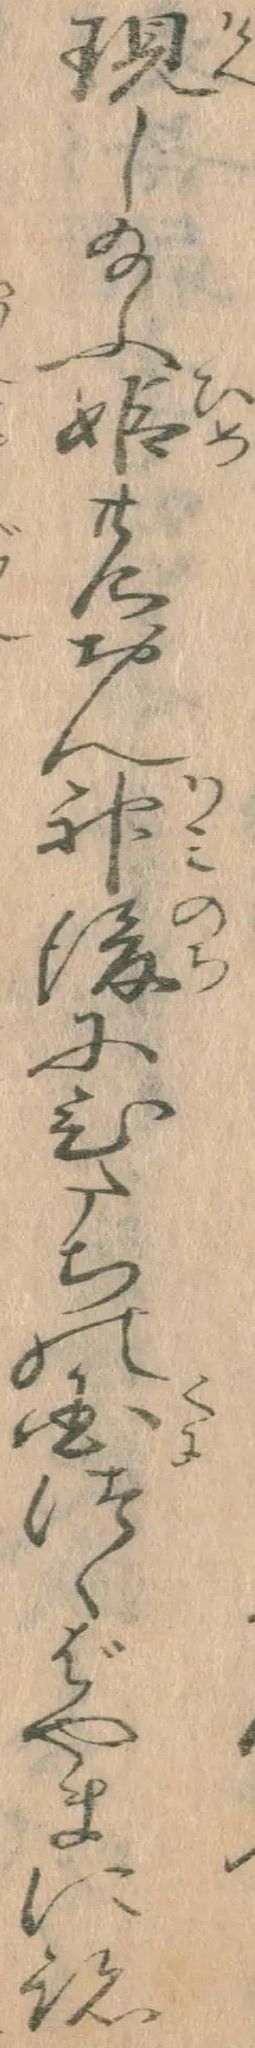現し給ふ姫のおん神後にひたちの国つくばやまに跡
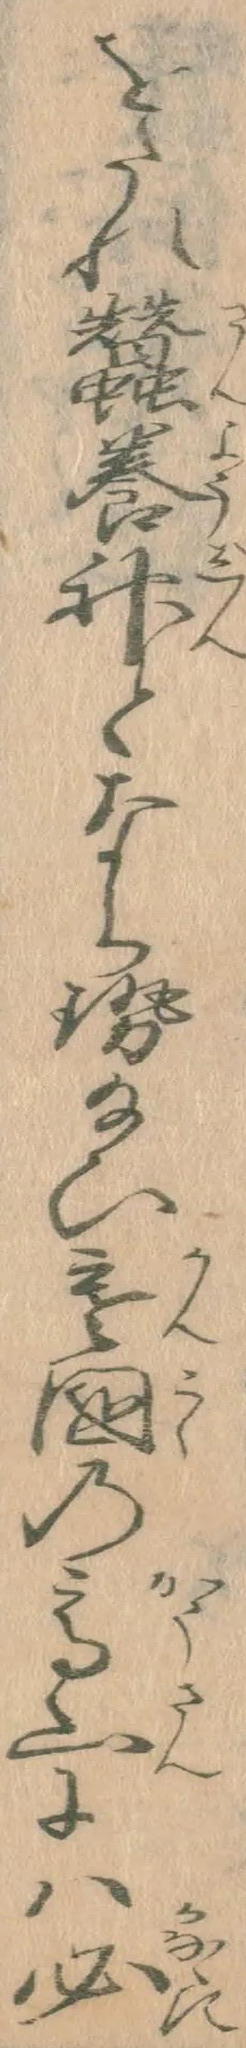をたれ蠺養神とならせ給ひ寒国の高山には必
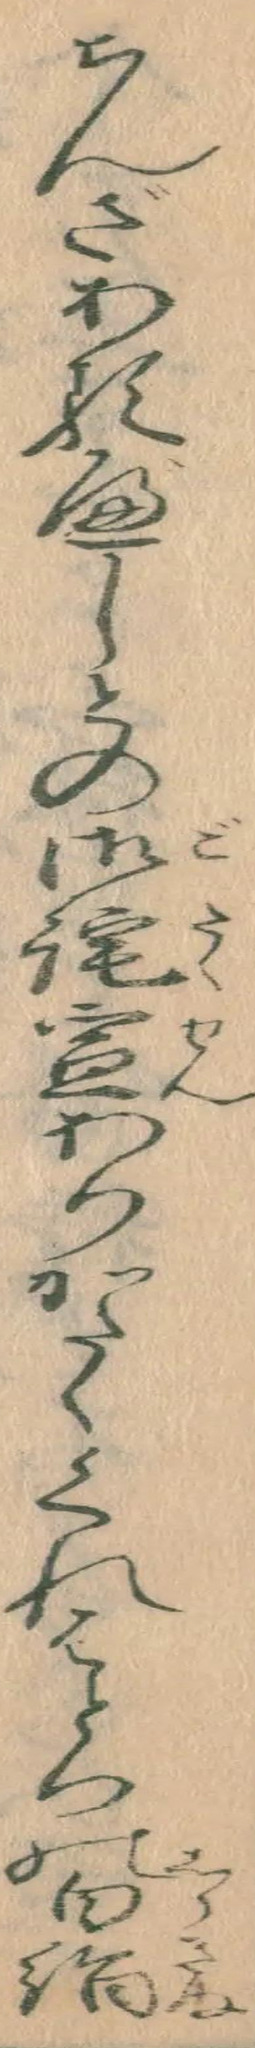ちんざあるべしとの御詫宣ありかたくくれはとりの白絹
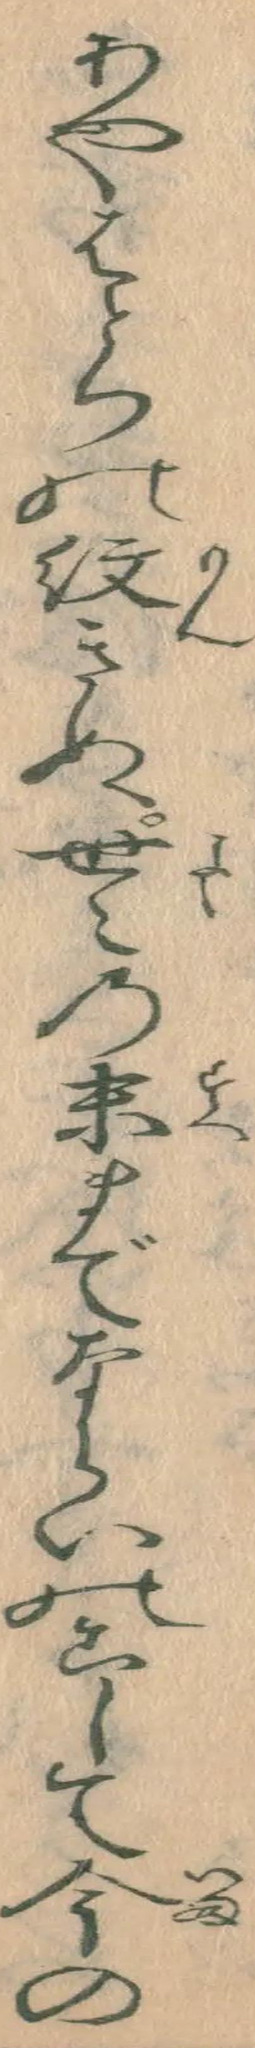あやはとりの紋きぬ。世々の末までならいのこして今の
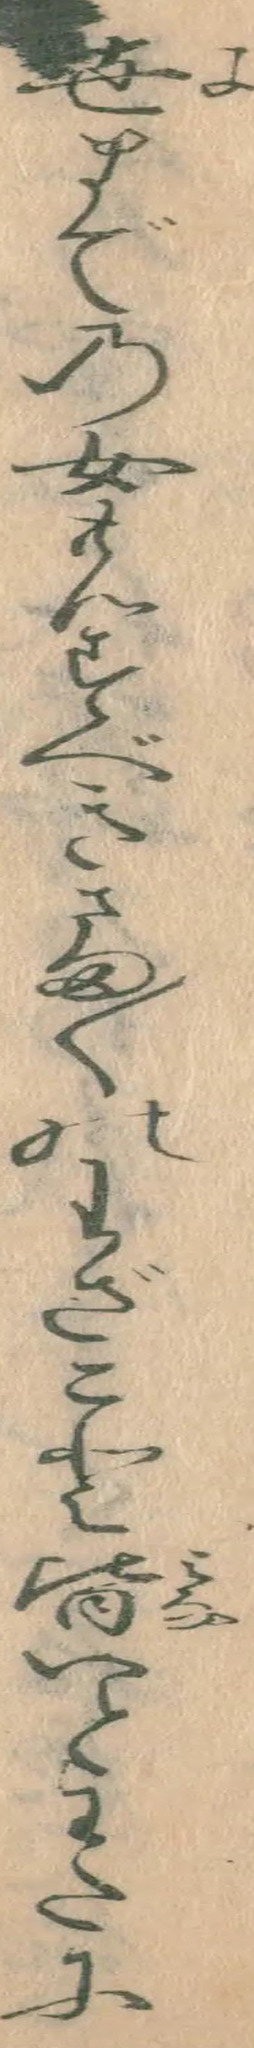世までの女のすべきさま〳〵のわざこと皆いとわたに
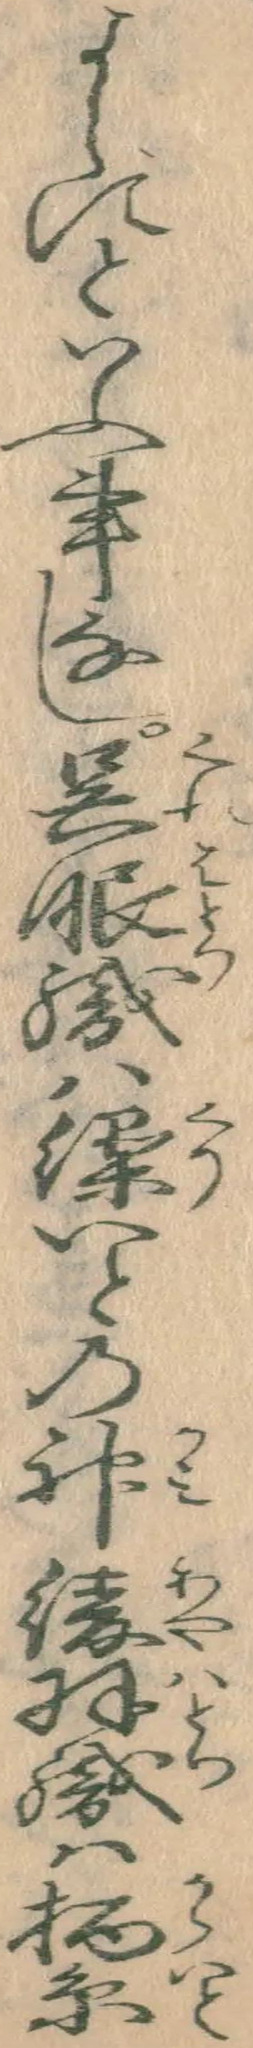よらずといふ事なし。呉服織は繰いとの神綾羽織は柄糸
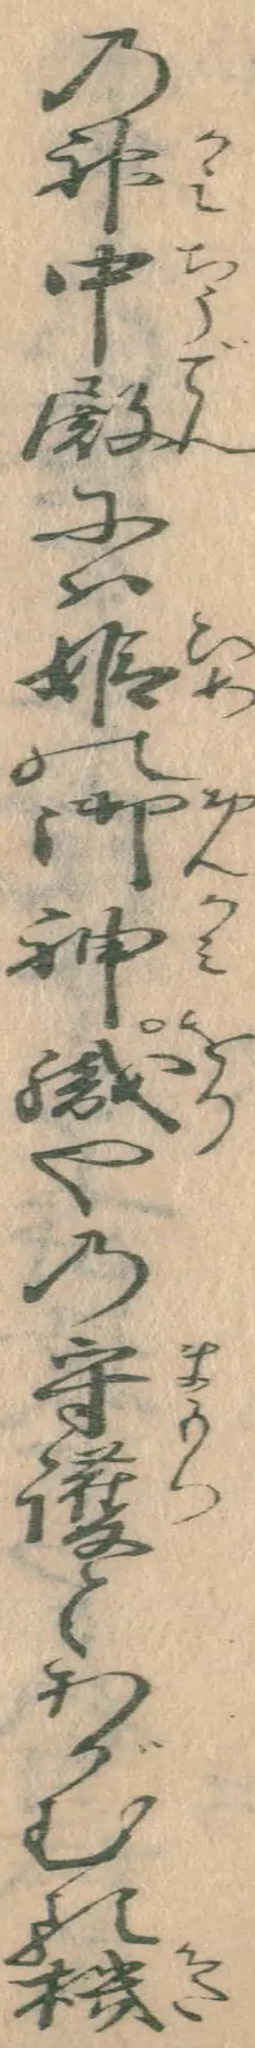の神中殿には姫の御神。織やの守護とあがむる機
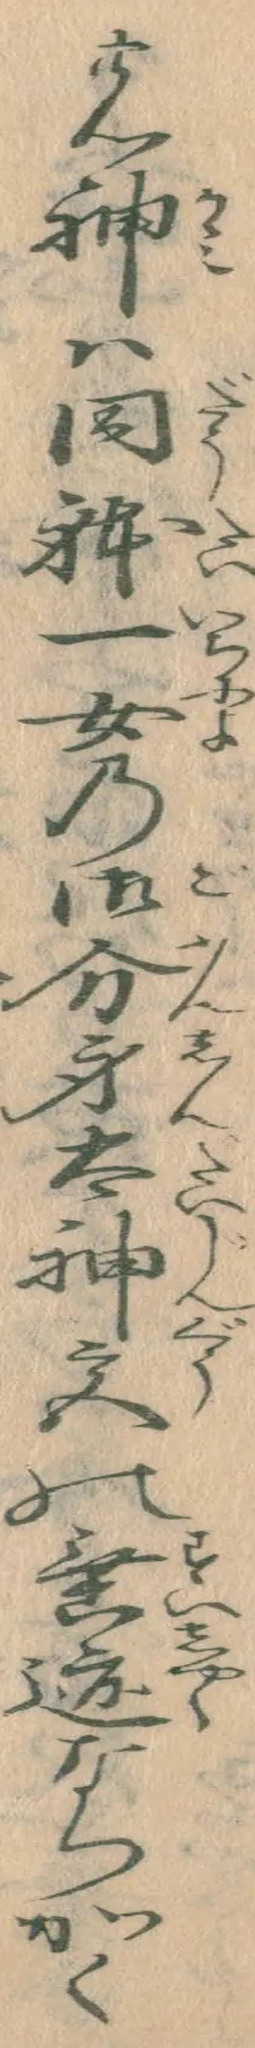の神は同体一女の御分身太神宮の垂迹なりかく
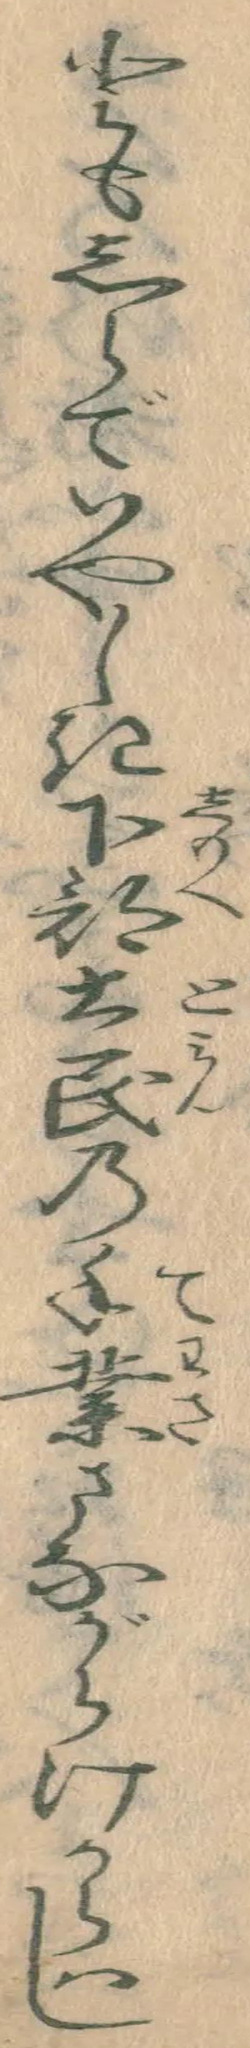ともしらでいやしき下部土民の手業さながらけからはし
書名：蚕飼養法記
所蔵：国立国会図書館 National Diet Library, JAPAN
